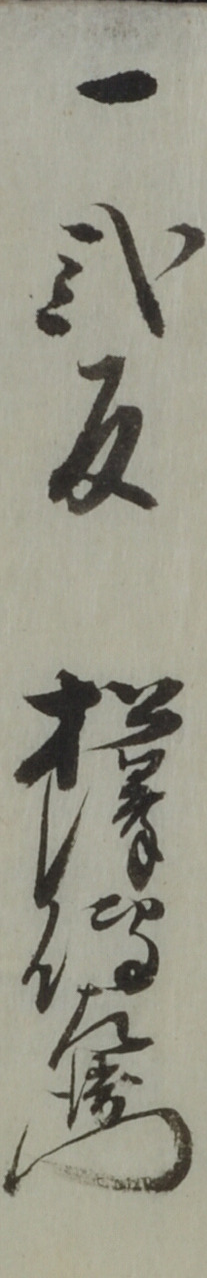一弐反松沢伝左衛門
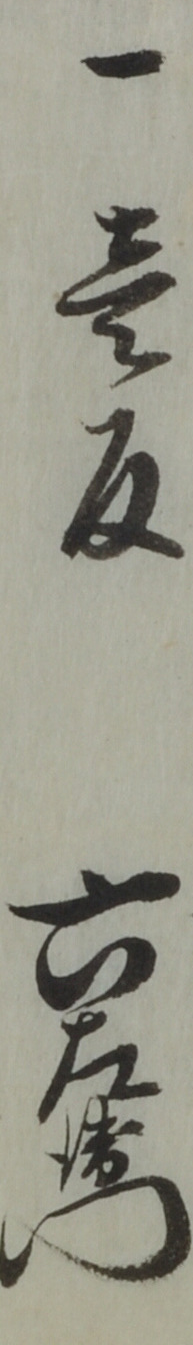一壱反六左衛門
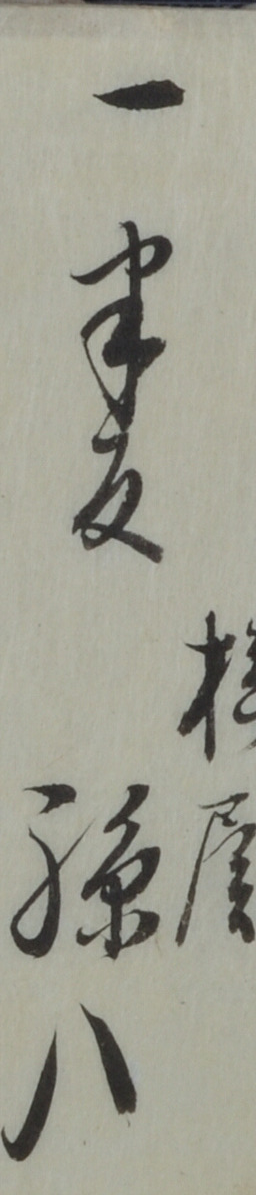一半反孫八

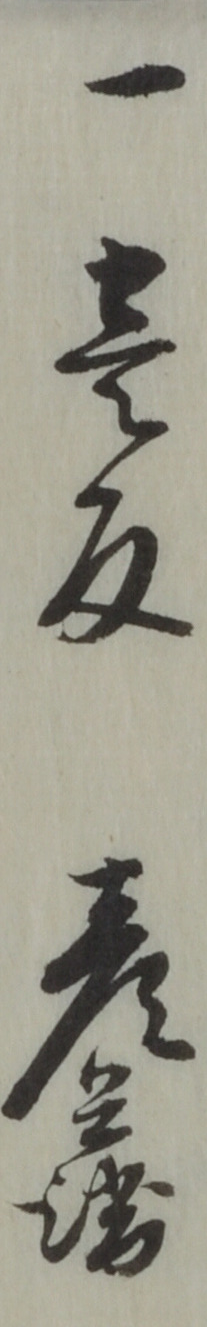一壱反彦兵衛
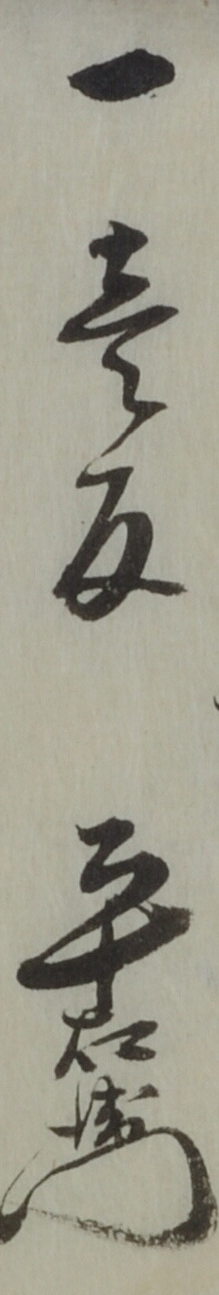一壱反平右衛門
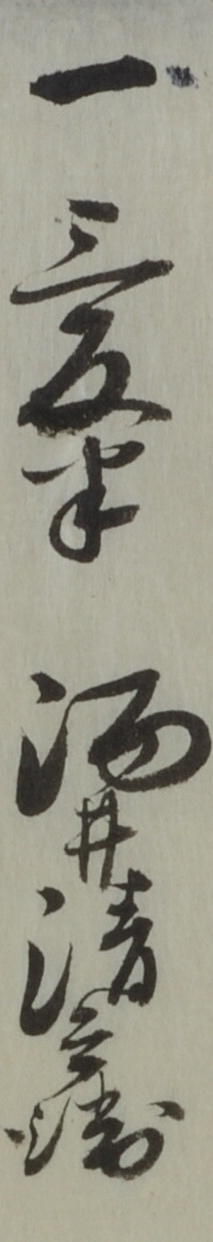一三反半酒井清兵衛
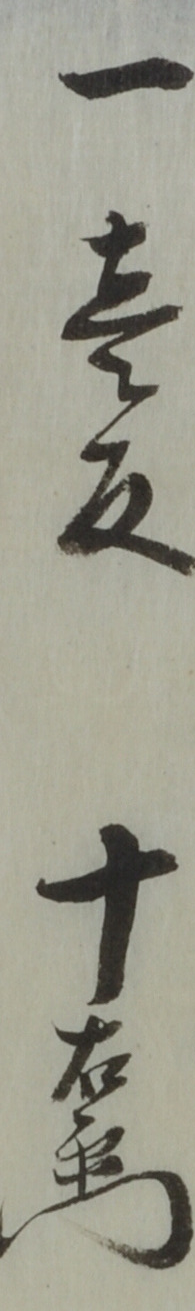一壱反十右衛門
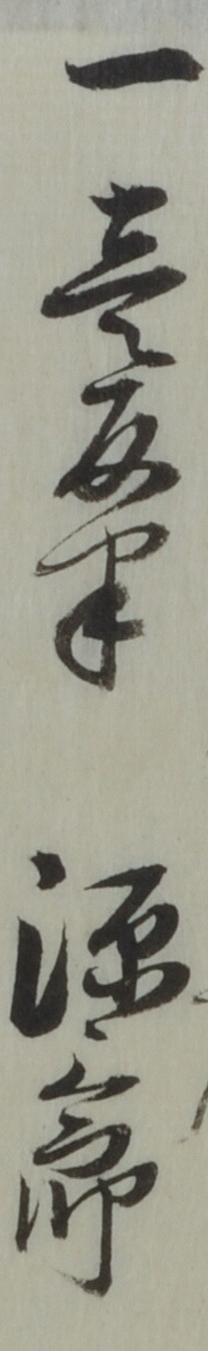一壱反半源三郎

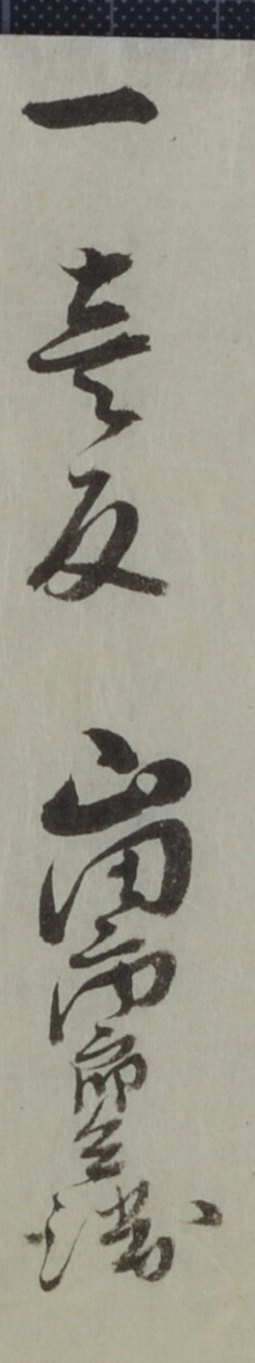一壱反山田市郎兵衛
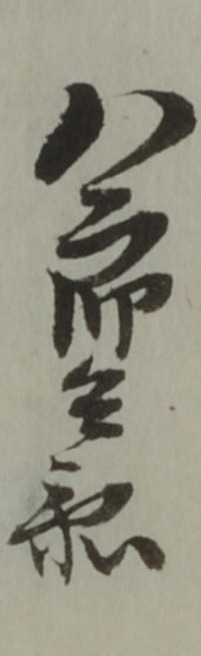八郎兵衛
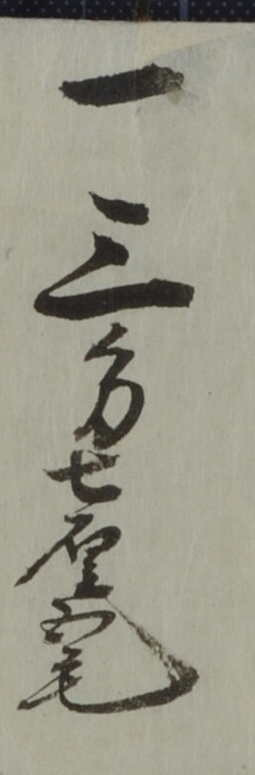三分七厘五毛
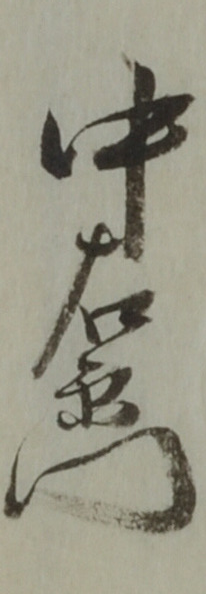中右衛門
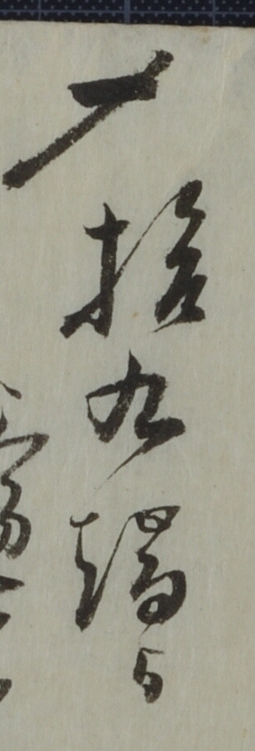〆拾九端与
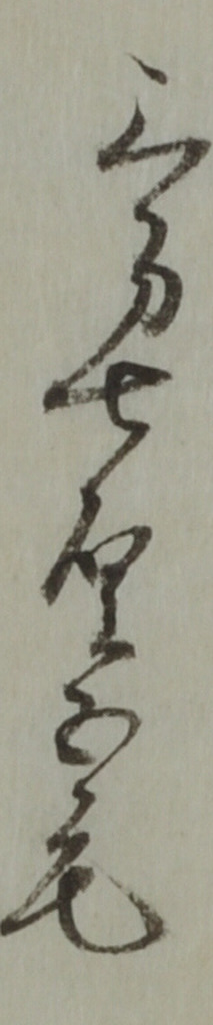三分七厘五毛

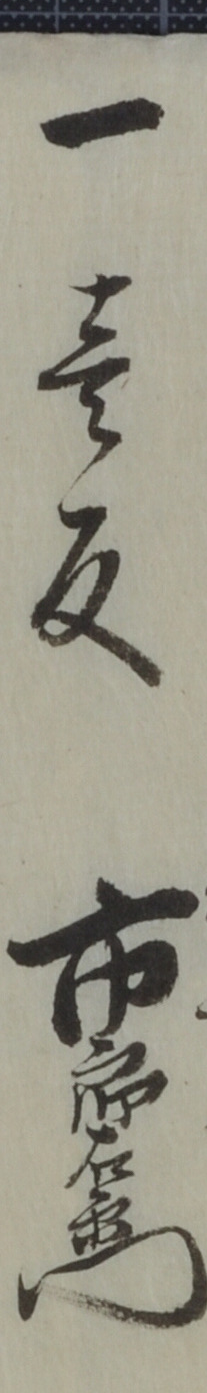一壱反市郎右衛門
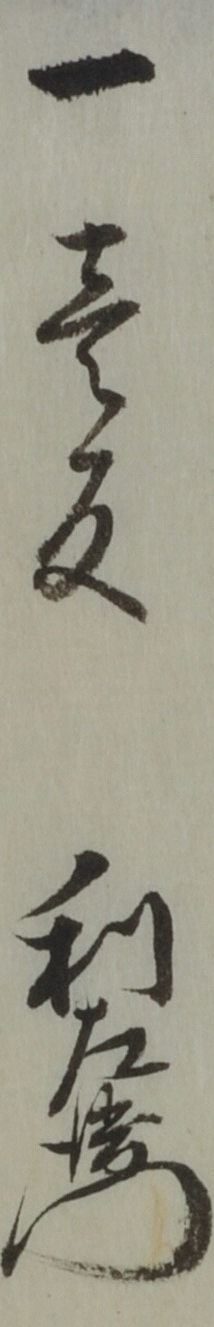一壱反利左衛門
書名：融通割合帳
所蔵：伊那市立高遠町図書館・合同会社AMANE
